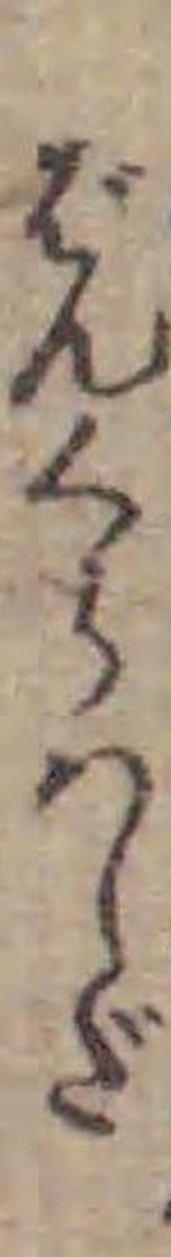ばんくらはしだ

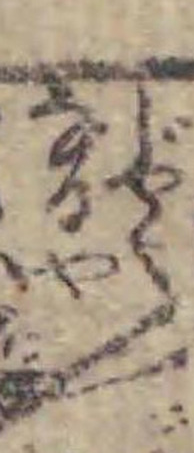じやく
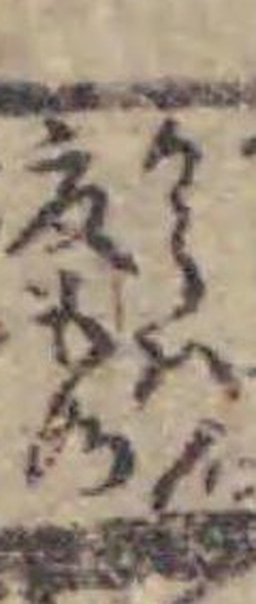夏も水
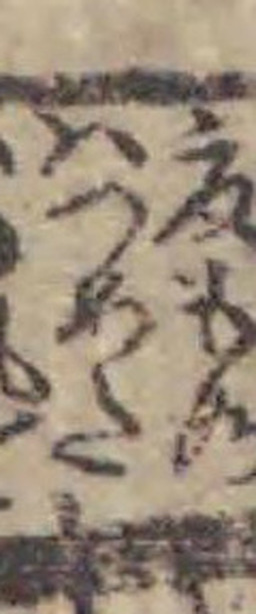はつめたい
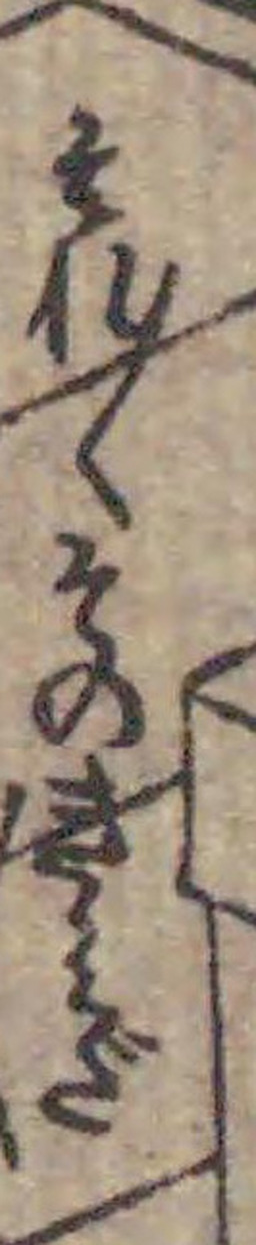それ〳〵そのきみだ
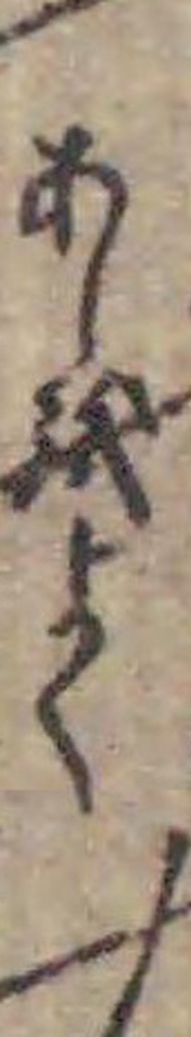あしをよく
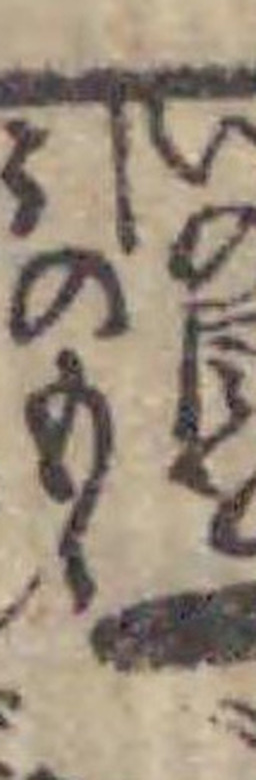引のもゝ
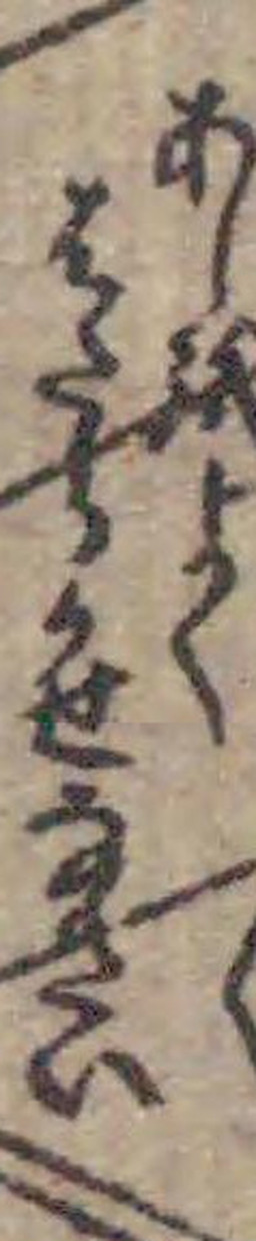はたらかせなさい
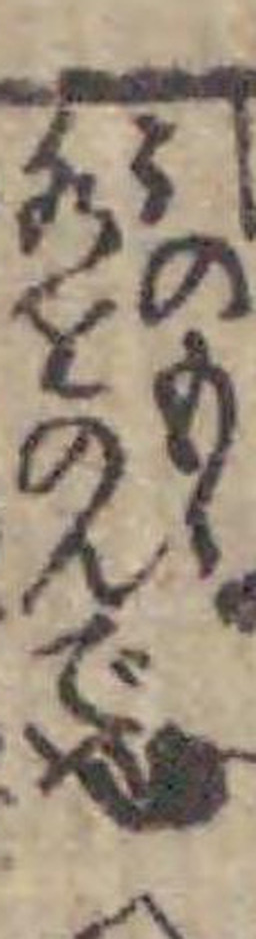水をのんでは
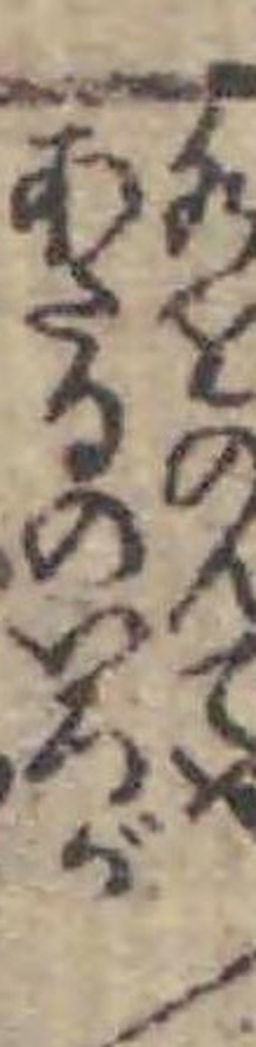あたるのいろが
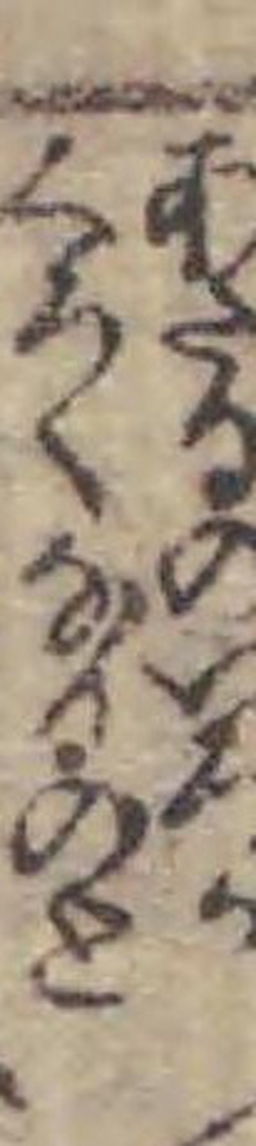くろくなるのと
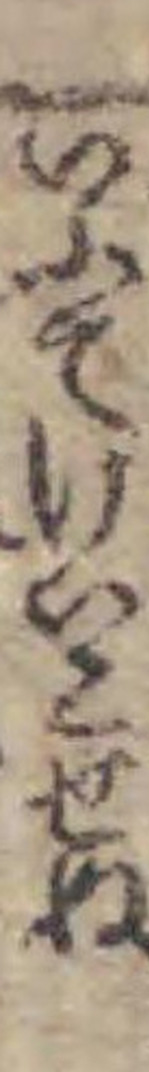いふてけいこせぬ
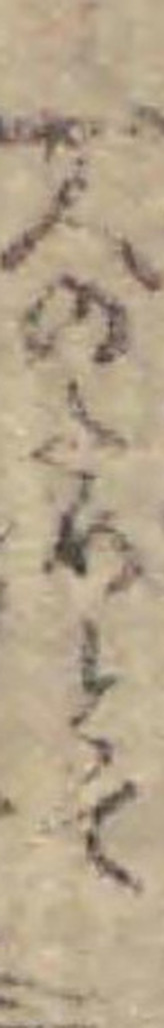人のためとて
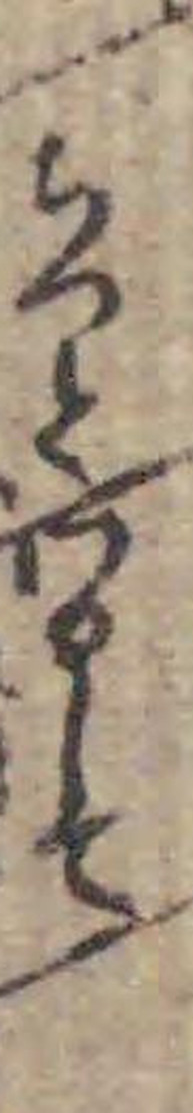ちつとわかして
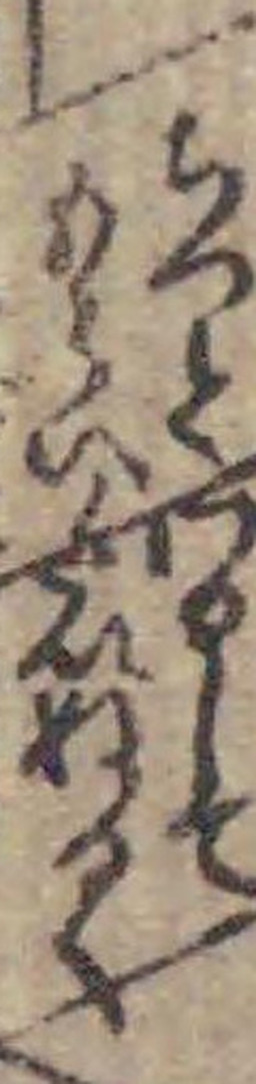もらいたいぬるく
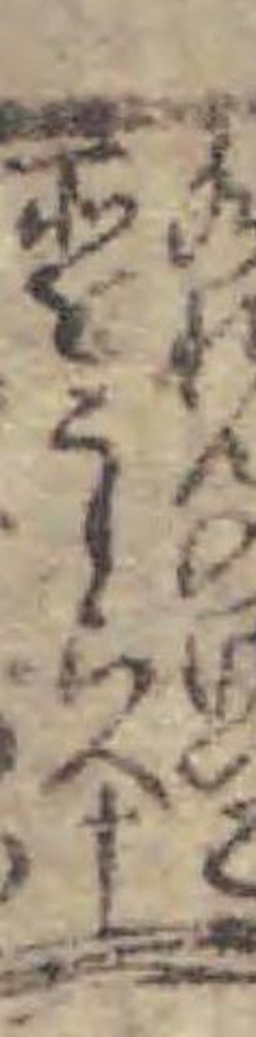所をこしらへ十
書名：本樹真猿浮気噺 : 3巻
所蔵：国立国会図書館 National Diet Library, JAPAN
